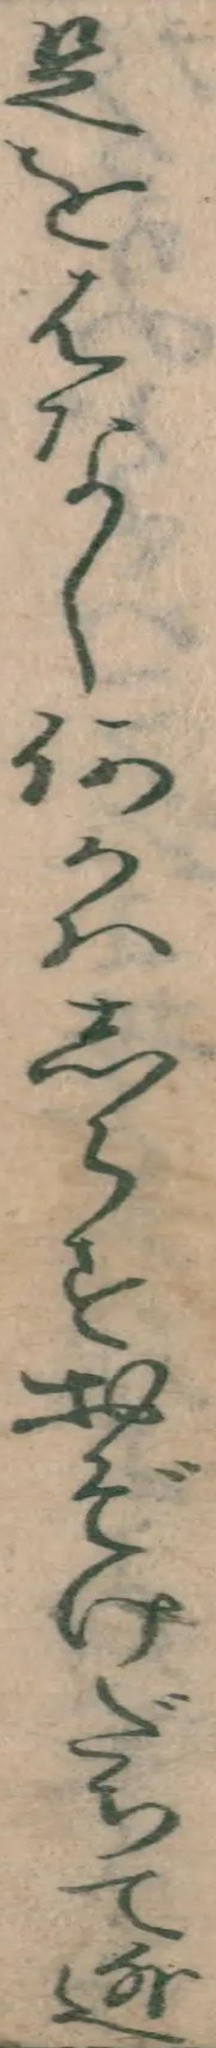足をはなし何かはしらすおぞけだちて逃
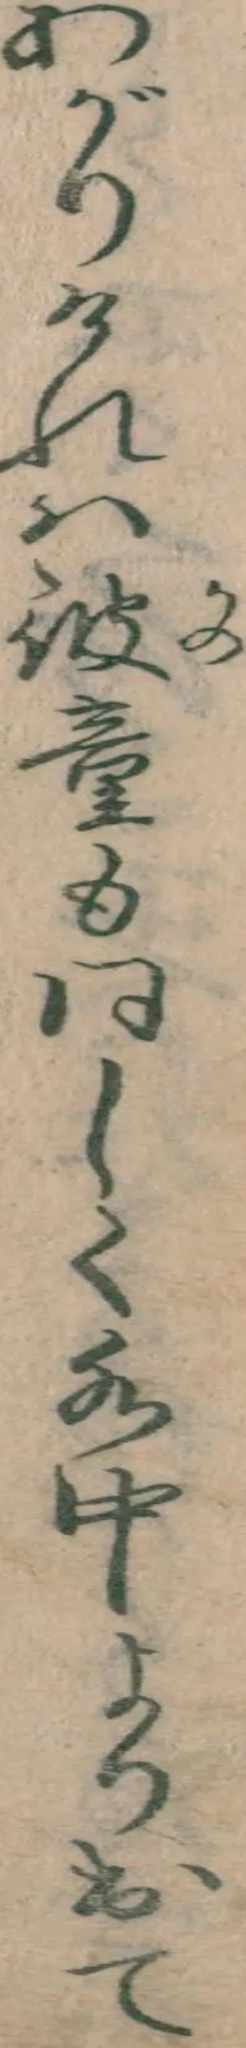あがりけれは彼童も同しく水中より出て
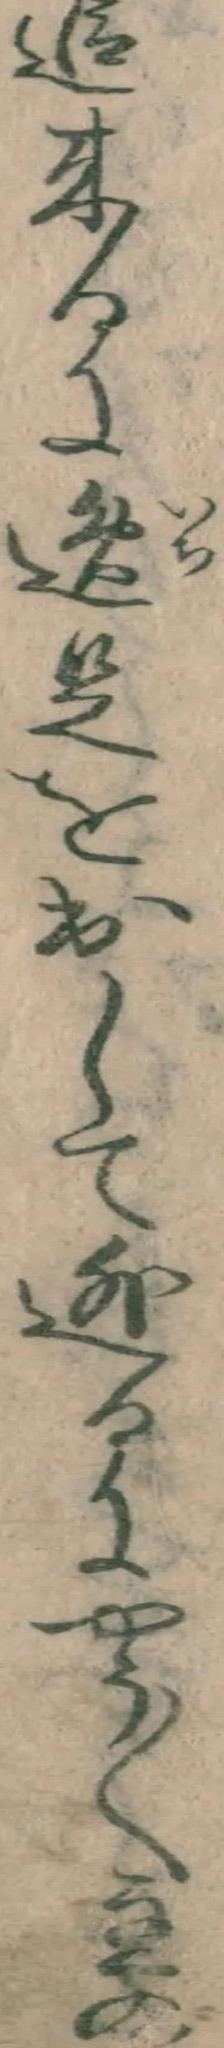追来るに逸足を出して逃るにやう〳〵主の
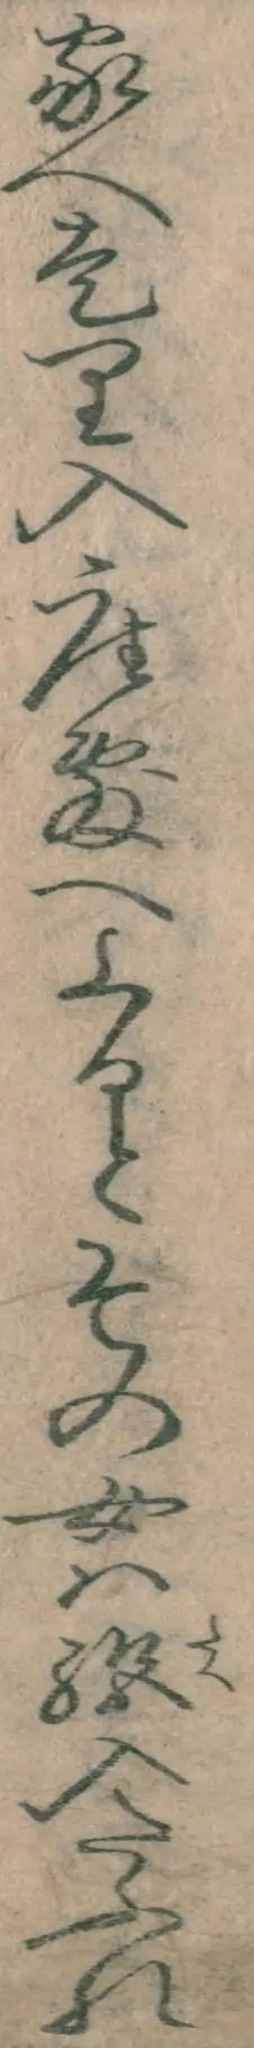家人走り入座敷へ上るとその女は絶入たふれ
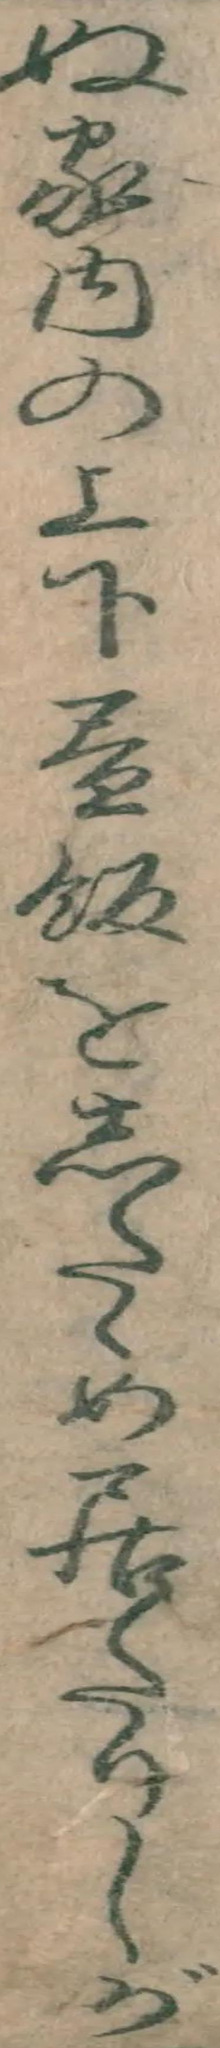ぬ家内の上下昼飯をしたゝめ居たりしが

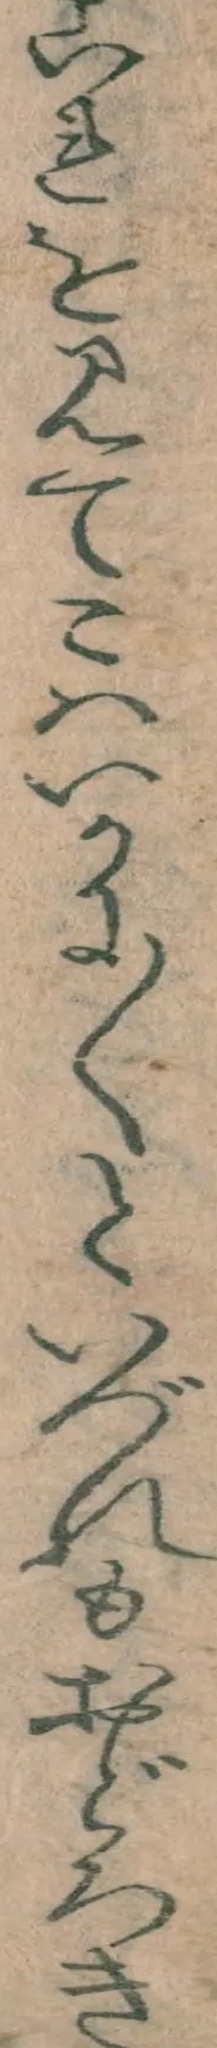これを見てこはいかに〳〵といづれもおどろき
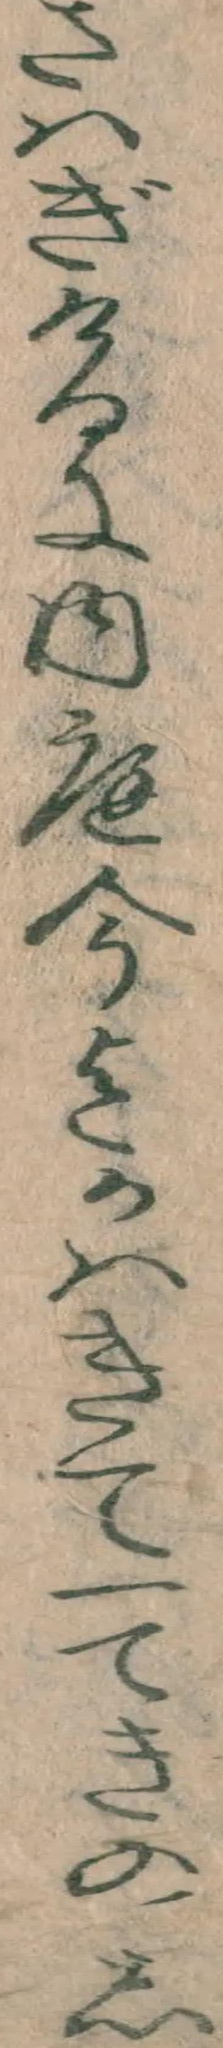さはぎけるに内庭今迄かはきて一てきのし
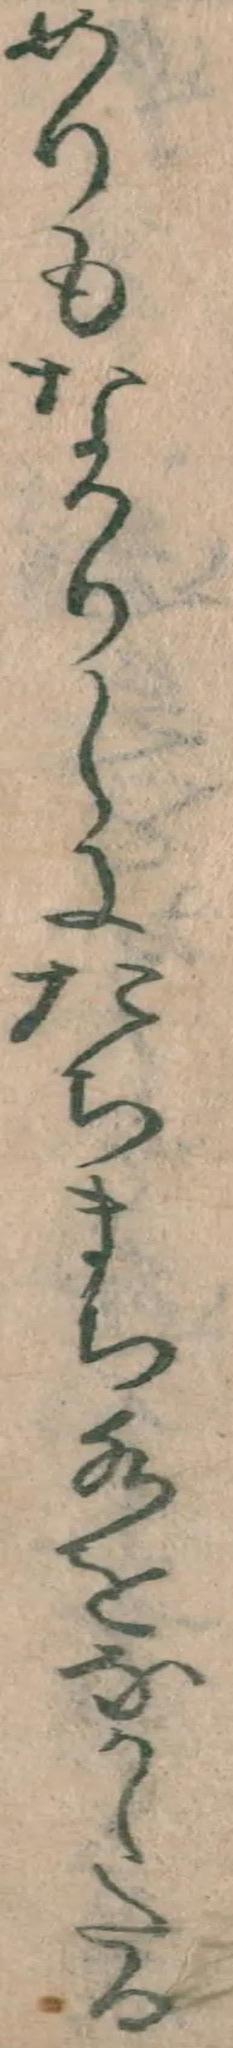めりもなかりしにたちまち水をなかしたる
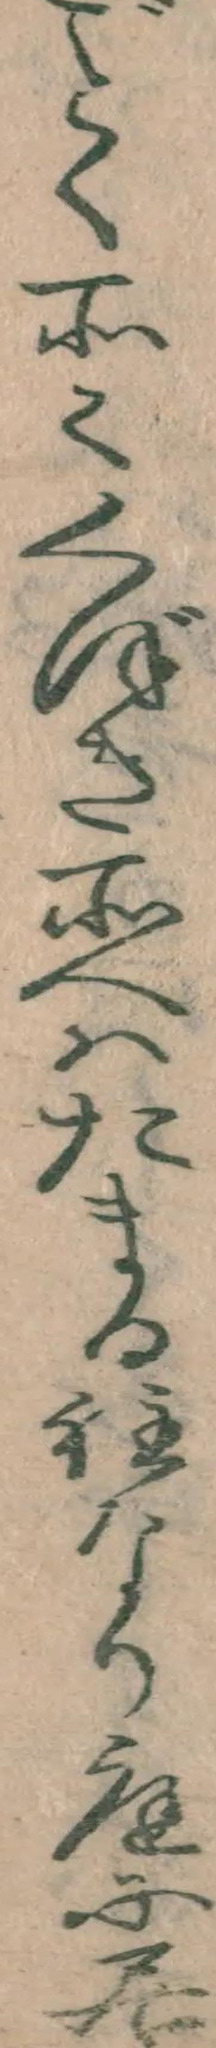ごとく所々くぼき所へはたまる程なり庭に居
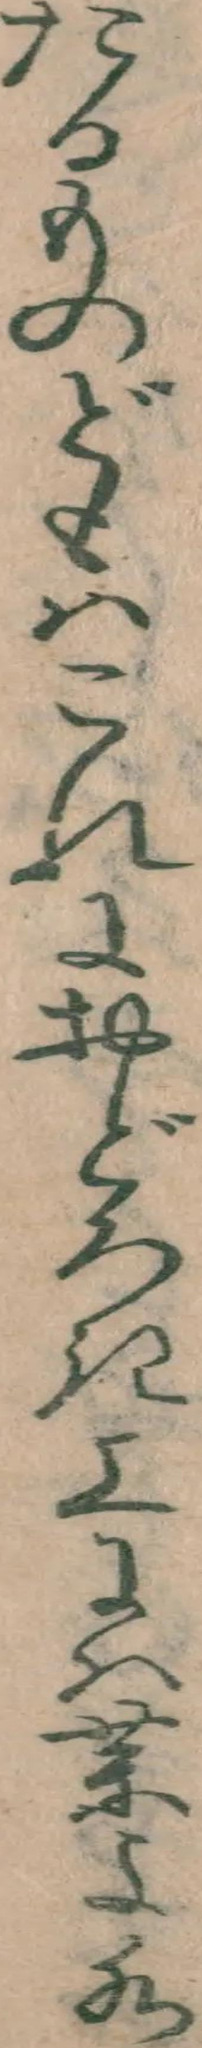たるものどもはこれにおどろき上には薬よ水
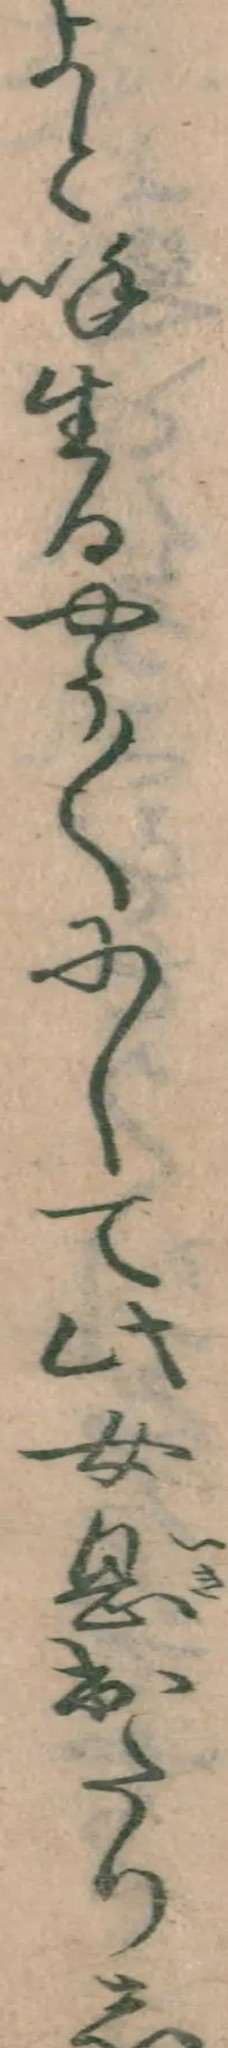よと呼生るやう〳〵にして此女息出たりし
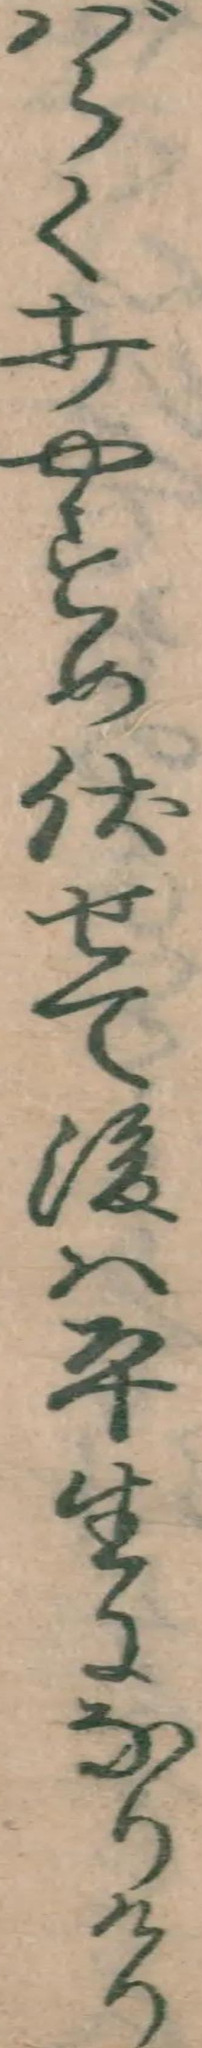ばらく打ちやすめ伏せて後は平生になりけり
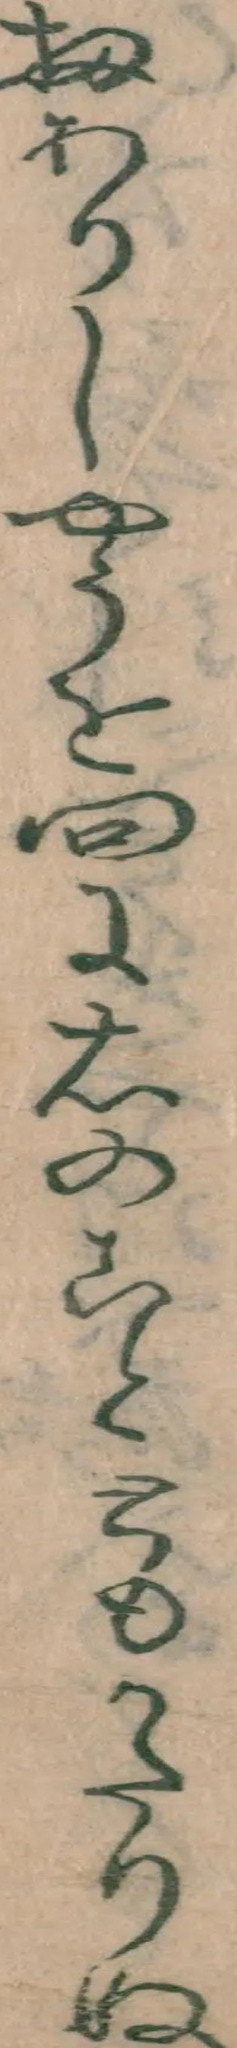扨ありしやうを問に右のことともかたりぬ
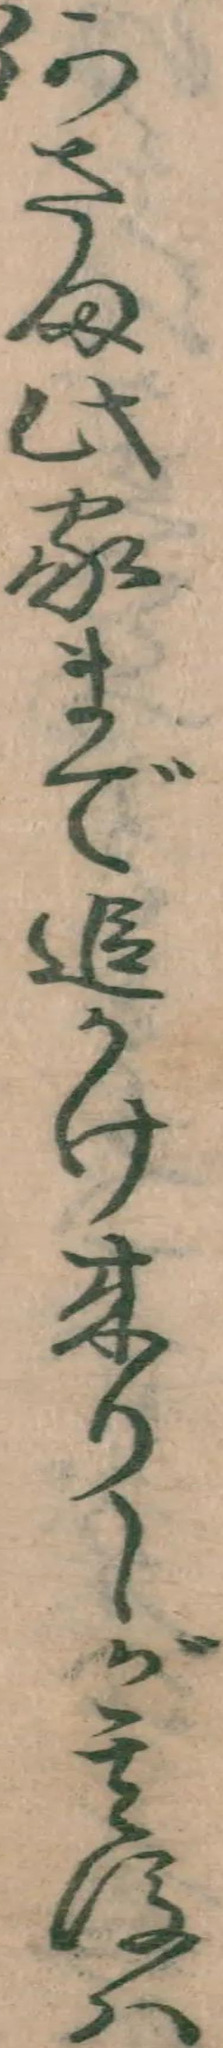何さま此家まで追かけ来りしが其後は
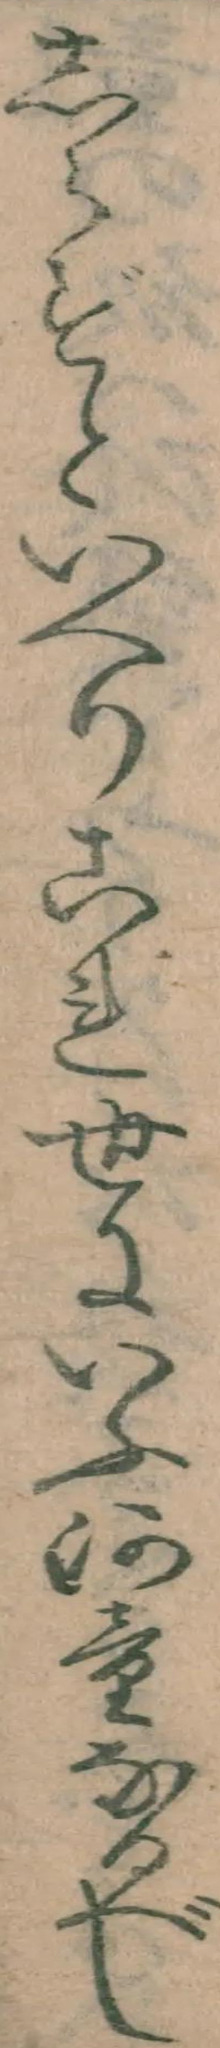しらずといへりこれ世にいふ河童なるべし
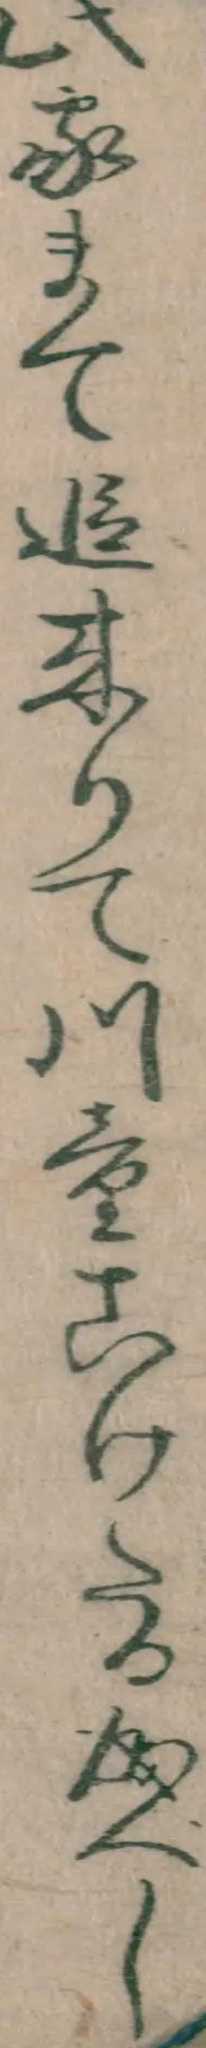此家まて追来りて川童こけたる成へし
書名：怪談御伽童 5巻. [1]
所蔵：国立国会図書館 National Diet Library, JAPAN
